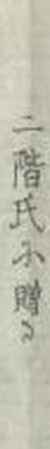二階氏に贈る
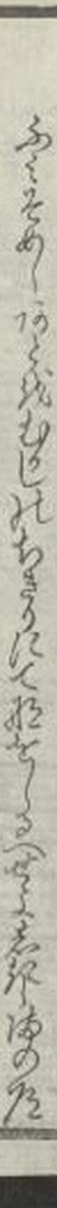ふみそめしあとをむかしのちきりにてなをしるへせよしきしまの道
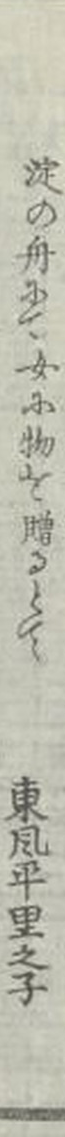淀の舟にて女に物を贈るとて東風平里之子
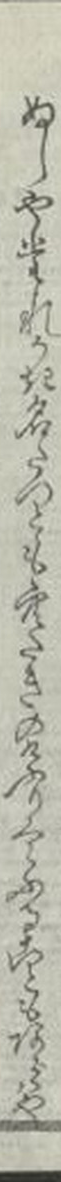ぬしやたれうき名たつとも空たきのけふりくゝふることもあらはや
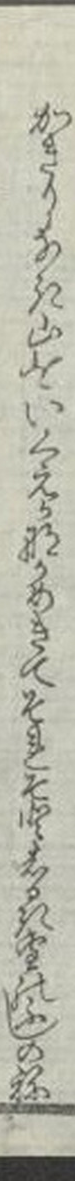かきりなき山をいくえかなかめきてそれそとしるき雪のふしのね
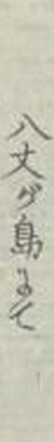八丈が島にて
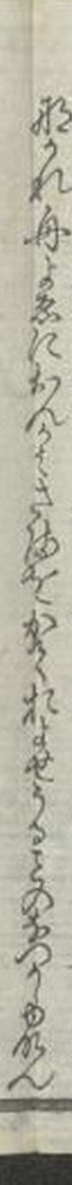なかれ舟よゑにおんかみさまをかておよせうるをのなつかしゆん
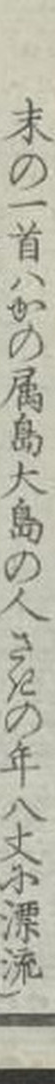末の一首はかの属島大島の人さきの年八丈に漂流し
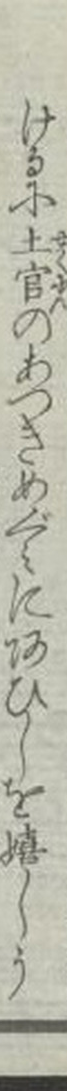けるに土官のあつきめぐみにあひしを嬉しう
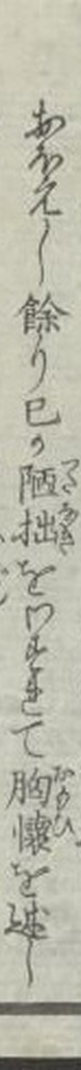おほえし余り巳の陋拙をわすれて胸懐を述し
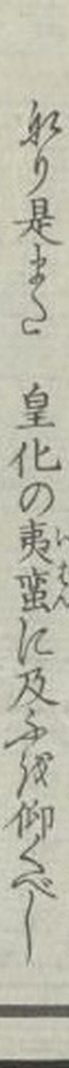なり是また皇化の夷蛮に及ふを仰くべし
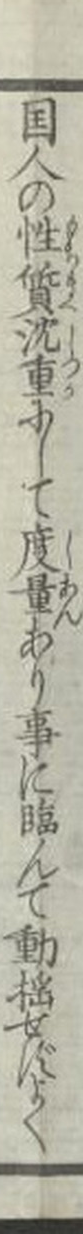国人の性質沈重にして度量あり事に臨んて動揺せずよく
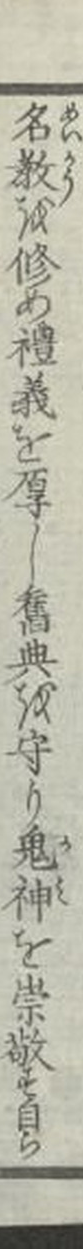名教を修め礼儀を厚し旧典を守り鬼神を崇敬す自ら
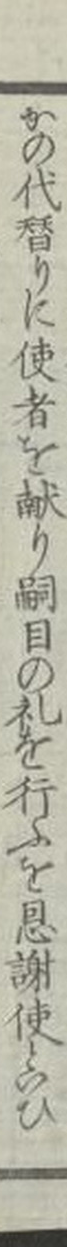かの代替りに使者を献り嗣目の礼を行ふを恩謝使といひ
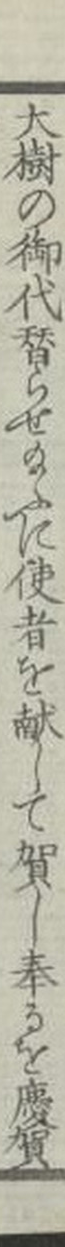大樹の御代替らせ給ふに使者を献して賀し奉るを慶賀
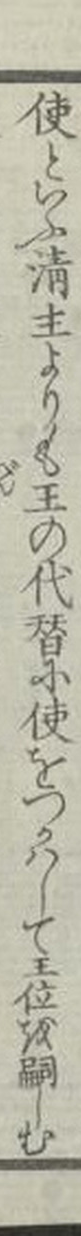使といふ清主よりも王の代替に使をつかはして王位を嗣しむ
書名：中山国使略
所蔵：University of the Ryukyus Library
